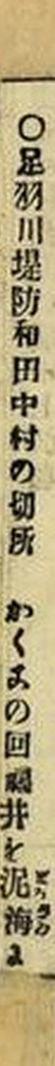○足羽川堤防和田中村の切所かくこの回福井を泥海に
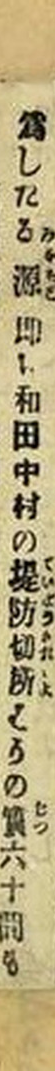爲したる源即ち和田中村の堤防切所はかの實六十間も
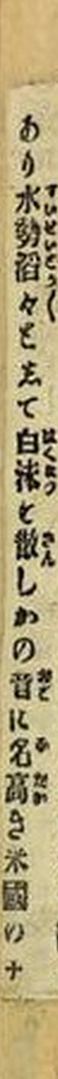あり水勢滔々として白沫を散しかの音に名高き米國のナ
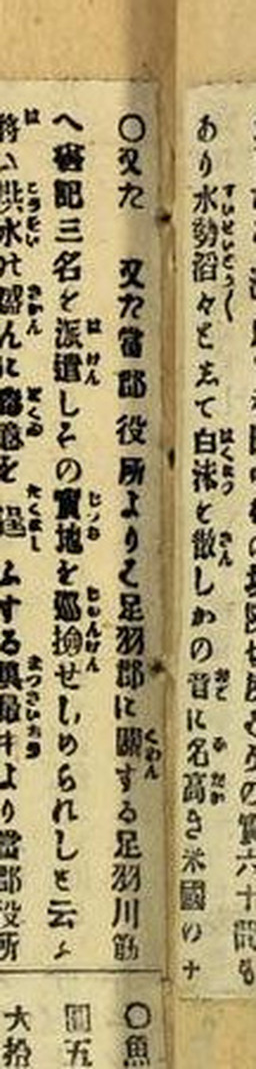○又た又た當郡役所よりは足羽郡に関する足羽川筋
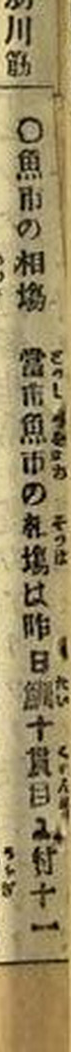○魚市の相塲當市魚市の相塲は昨日鯛十貫目に付十一
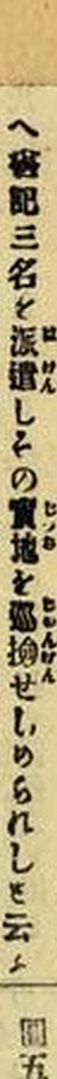へ書記三名を派遣しその實地を巡撿せしめられしと云ふ
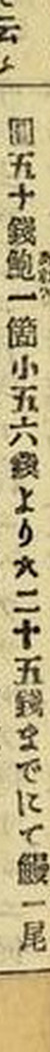圓五十錢鮑一箇小五六錢より大二十五錢までにて鰻一尾
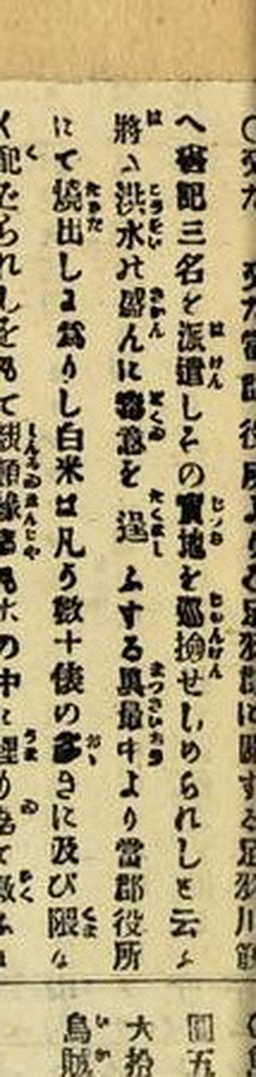將た洪水の盛んに毒意を逞ふする真最中より當郡役所
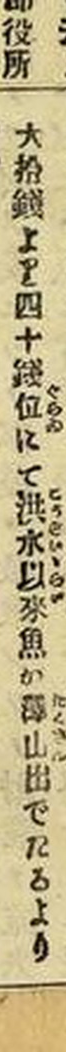大拾錢より四十錢位にて洪水以來魚が澤山出でたるより
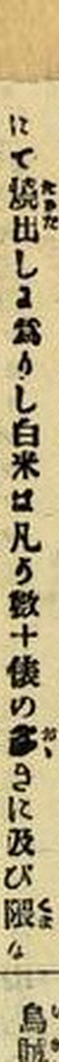にて燒出しに爲りし白米は凡そ数十俵の多きに及び隈な
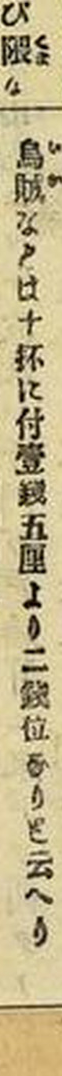烏賊なとは十杯に付壹錢五厘より二錢位なりと云へり
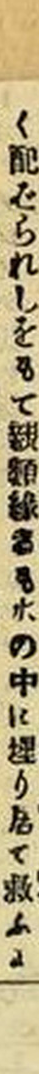く配ばられしをもて親類縁者も水の中に埋り居て救ふに
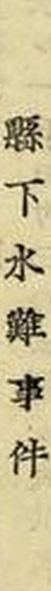縣下水難事件
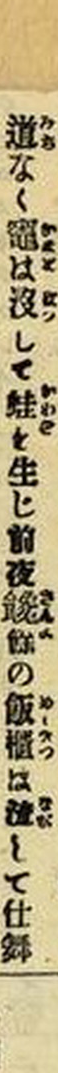道なく竈は没して蛙を生じ前夜饞餘の飯櫃は流して仕舞
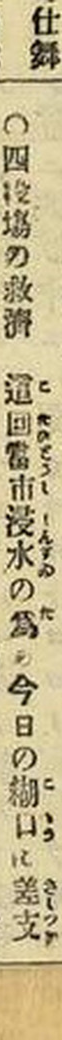○四役塲の救濟這回當市浸水の爲め今日の糊口に差支
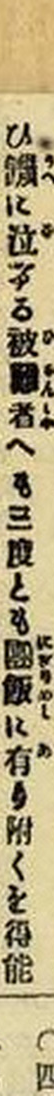ひ饑に泣ける被難者へも三度とも團飯に有り附くを得能
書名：温古集 五巻
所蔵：福井県文書館 Fukui Prefectural Archives
